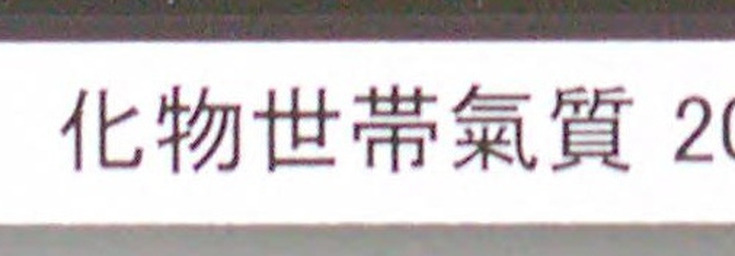化物世帯気質二冊
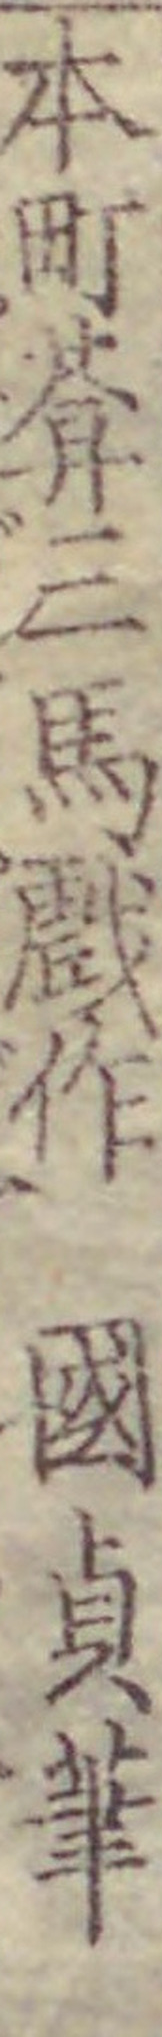本町庵三馬戯作国貞筆
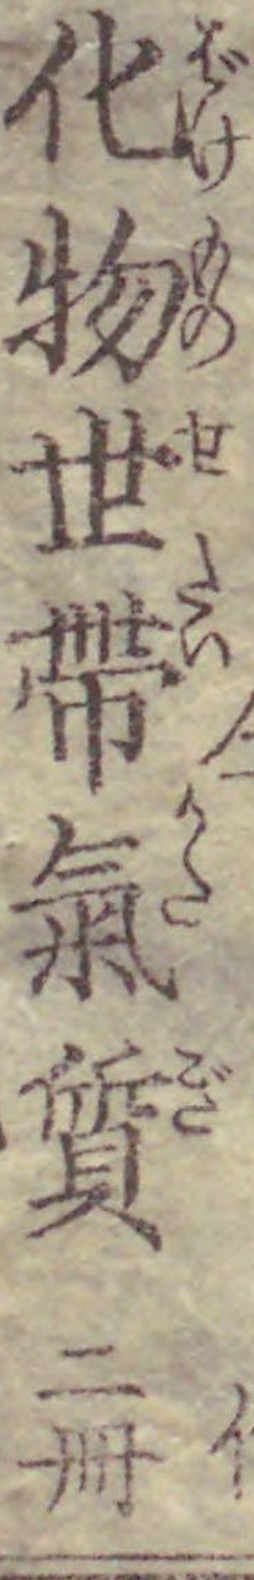化物世帯気質二冊
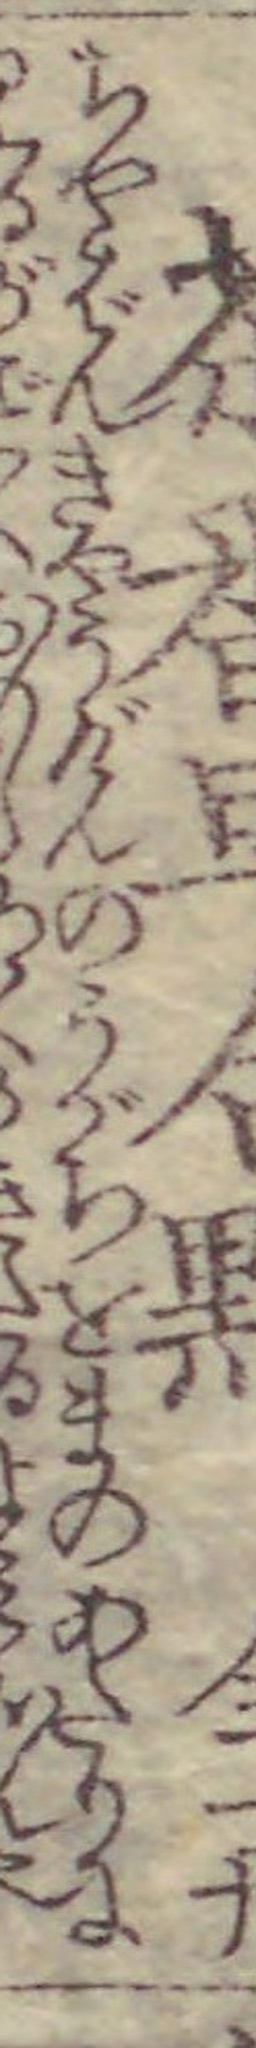ちやばんきやうげんのうがちをまのあたりに
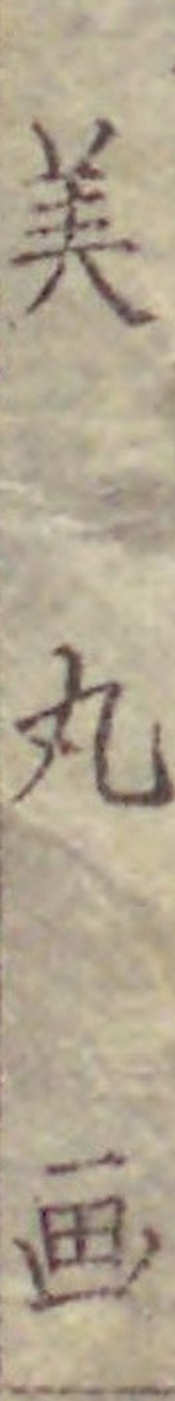美丸画
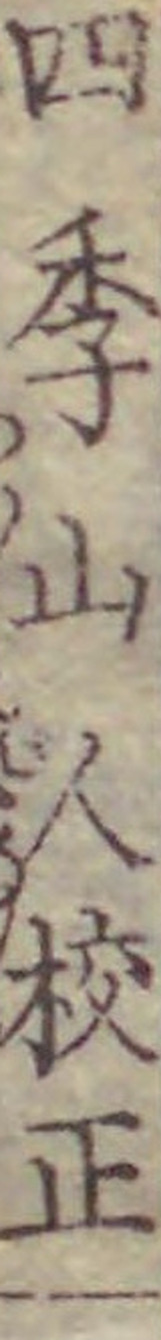四季山人校正
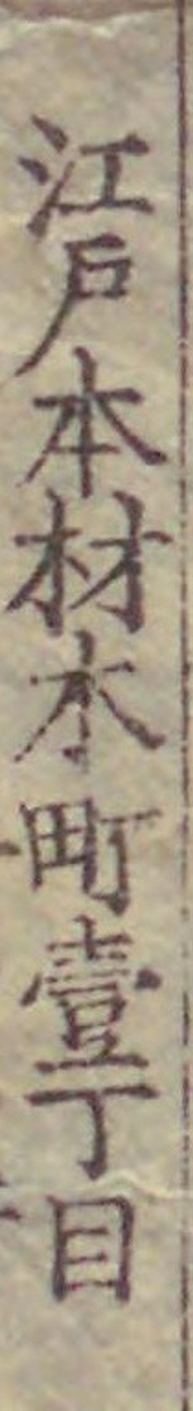江戸本材木町壹丁目
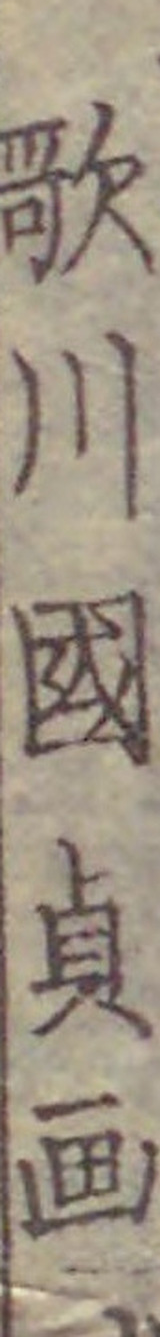歌川国貞画
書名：化物世帯氣質
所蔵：国立国会図書館 National Diet Library, JAPAN
